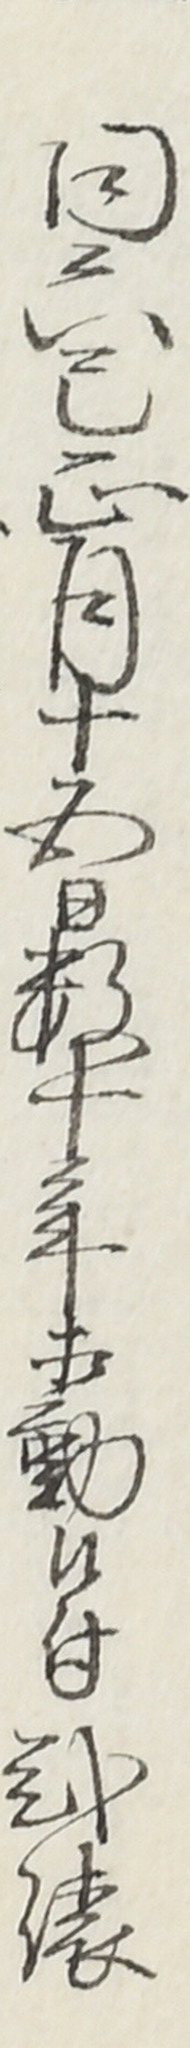一同六巳正月十五日数十年相勤候付弐俵
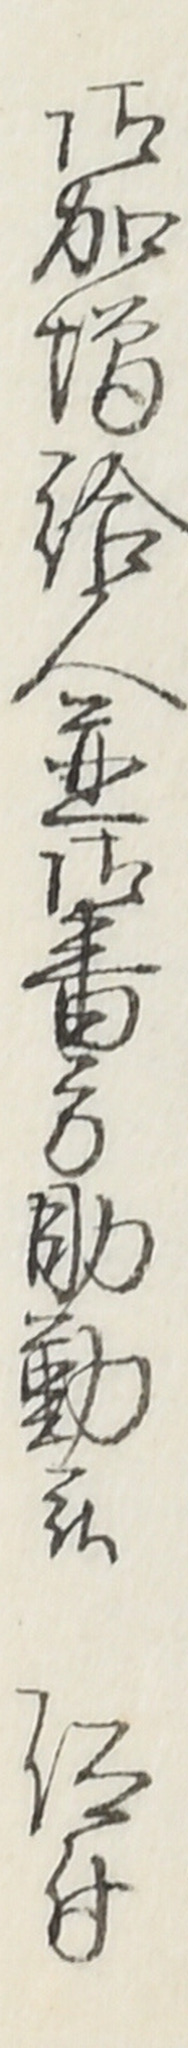御加増給人並御番方助勤被仰付

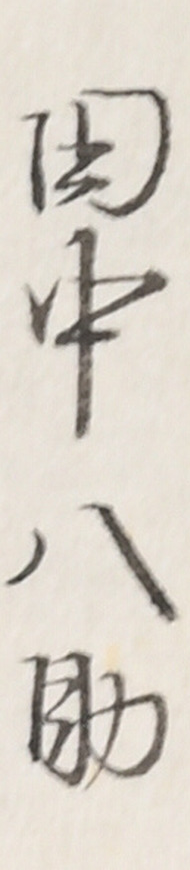田中八助
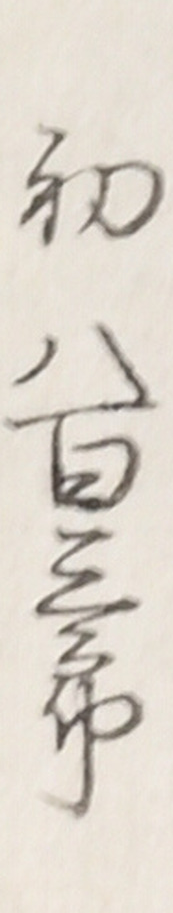初八百三郎
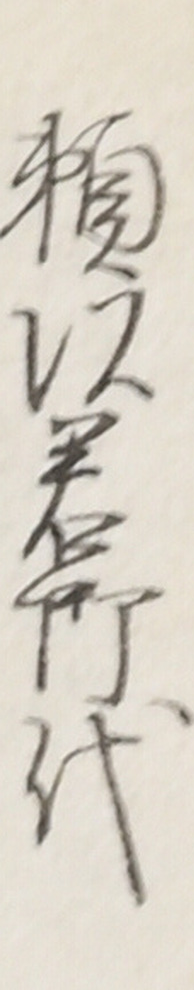頼以君御代
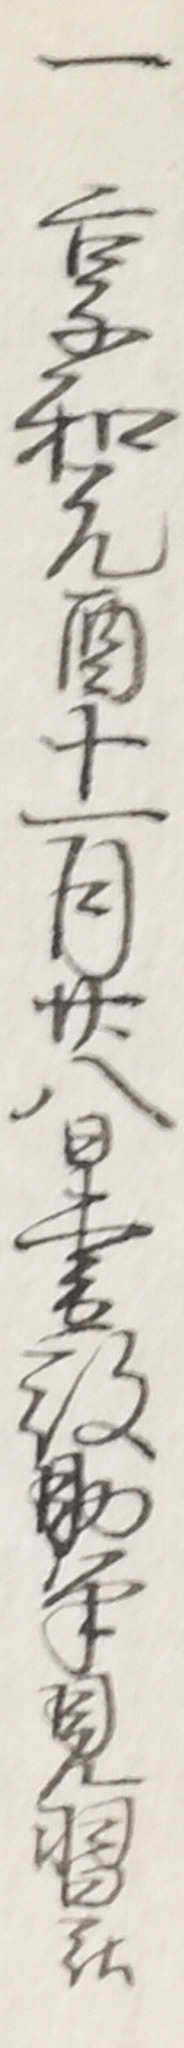一享和元酉十一月廿八日書役助筆見習被
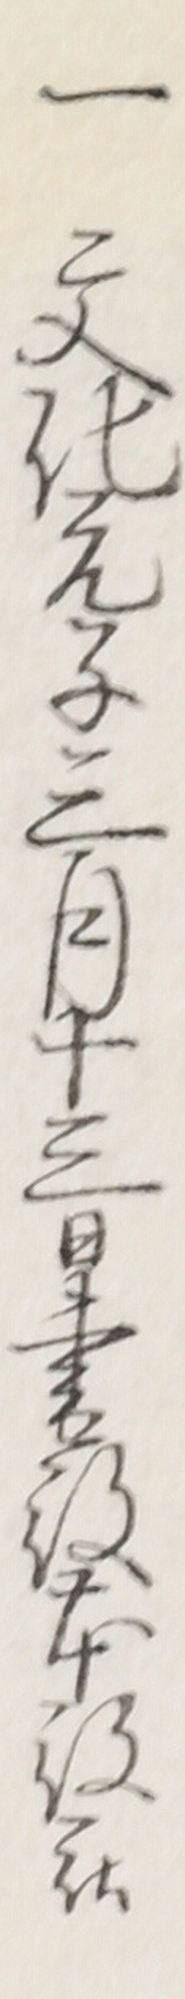一文化元子三月十三日書役本役被
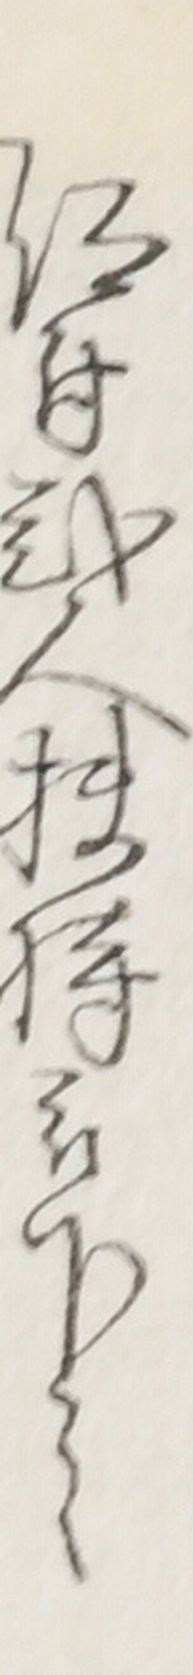仰付弐人扶持被下之
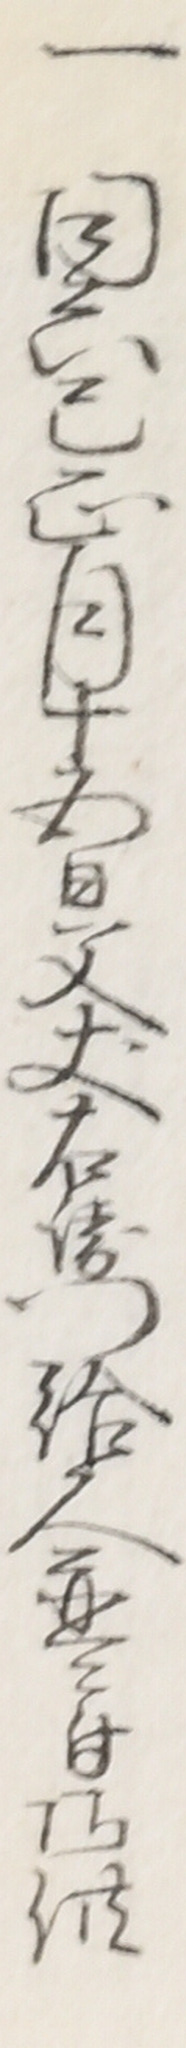一同六巳年正月十五日父丈右衛門給人並ニ付御供
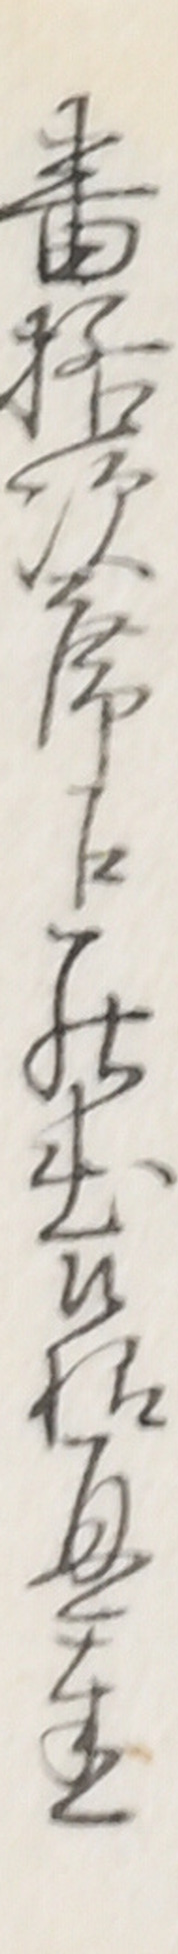番格次席江罷出候様通達
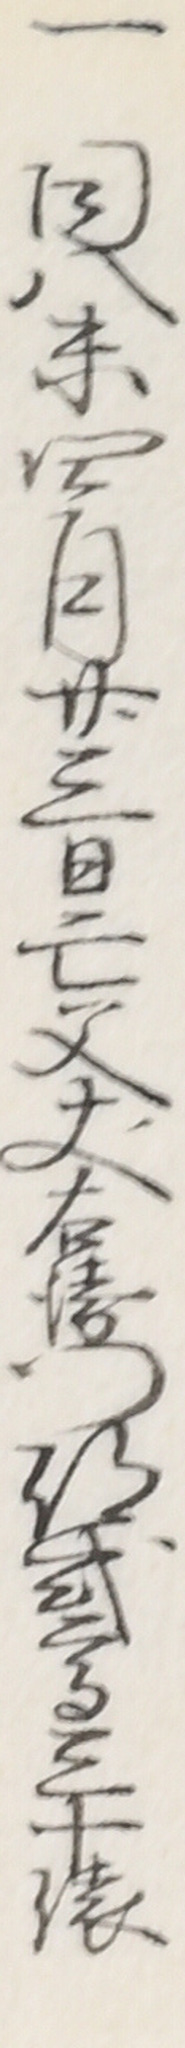一同八未四月廿三日亡父丈右衛門跡式高三十俵
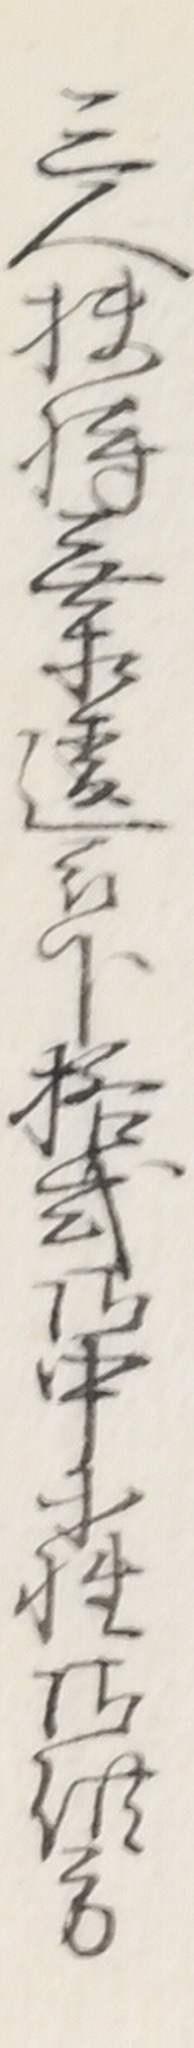三人扶持無相違被下格式御中小性御供方
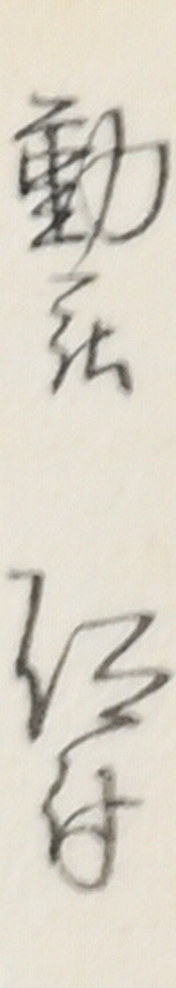勤被仰付
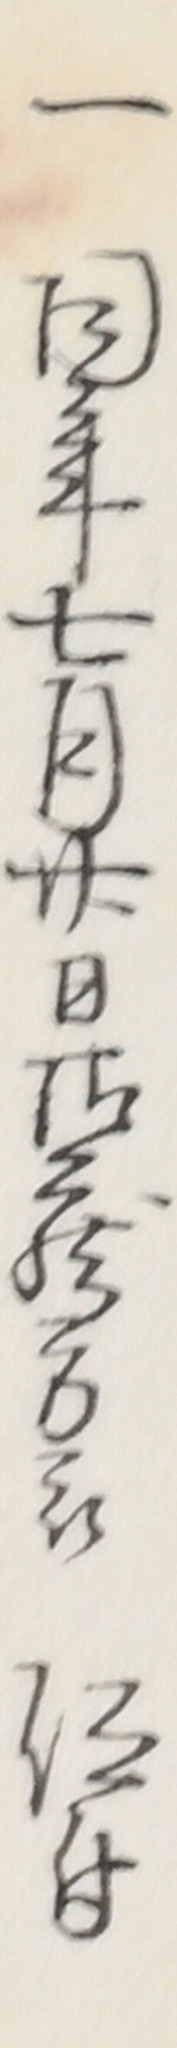一同年七月廿日御蔵方被仰付
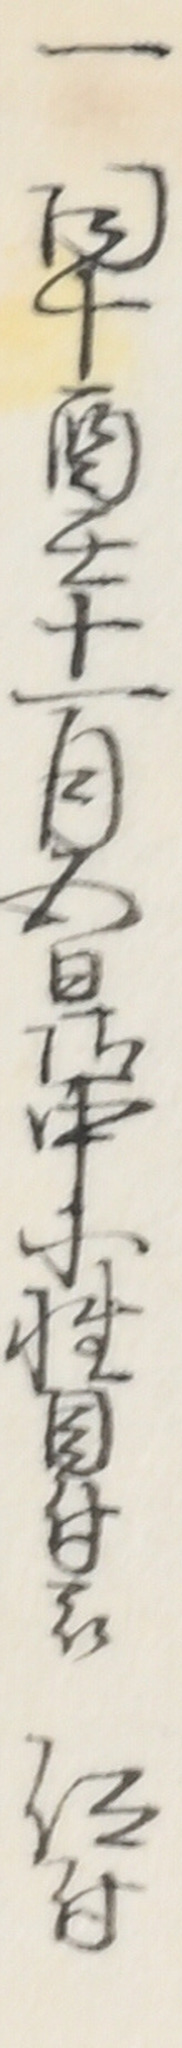一同十酉閏十一月五日御中小性目付被仰付
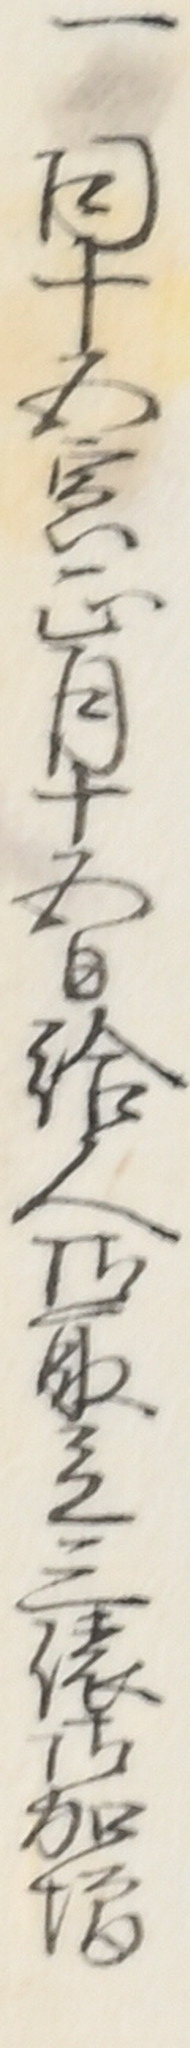一同十五寅正月十五日給人御取立三俵御加増
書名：給人諸士勤仕録（七）
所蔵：伊那市立高遠町図書館・合同会社AMANE
